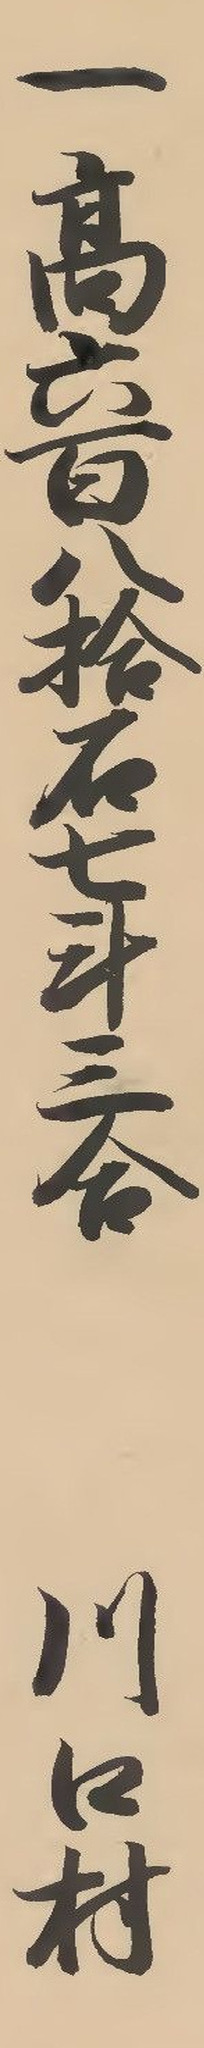一高六百八拾石七斗三合川口村
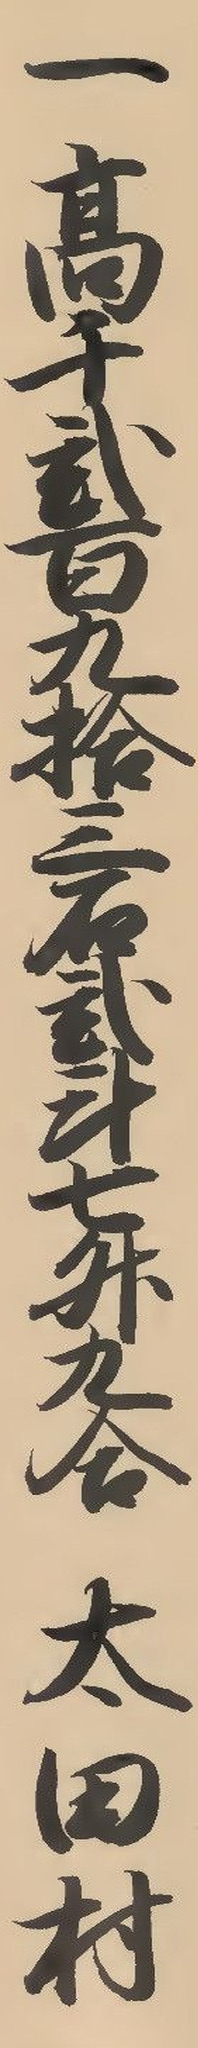一高千弐百九拾三石弐斗七升九合太田村
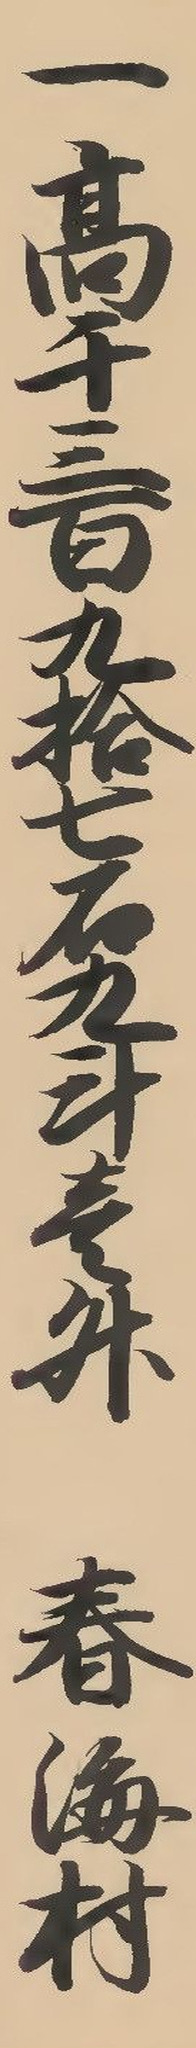一高千三百九拾七石九斗壱升春海村
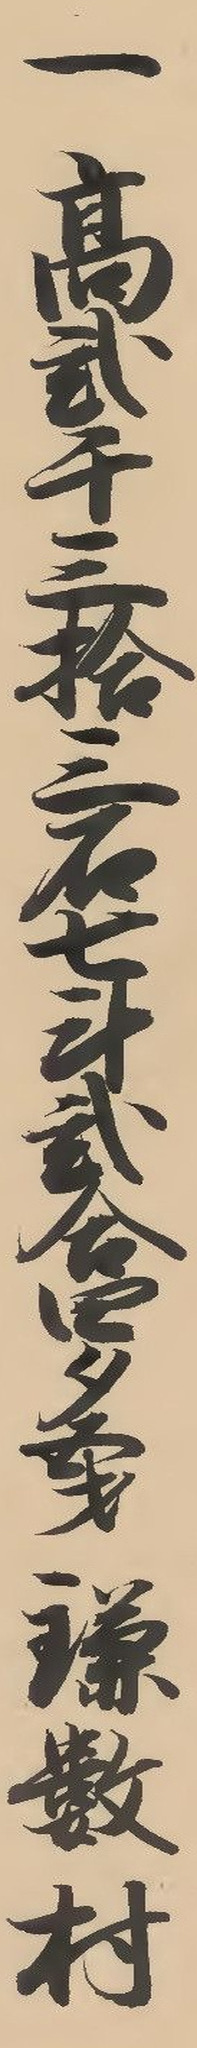一高弐千三拾三石七斗弐合四勺五才鎌数村
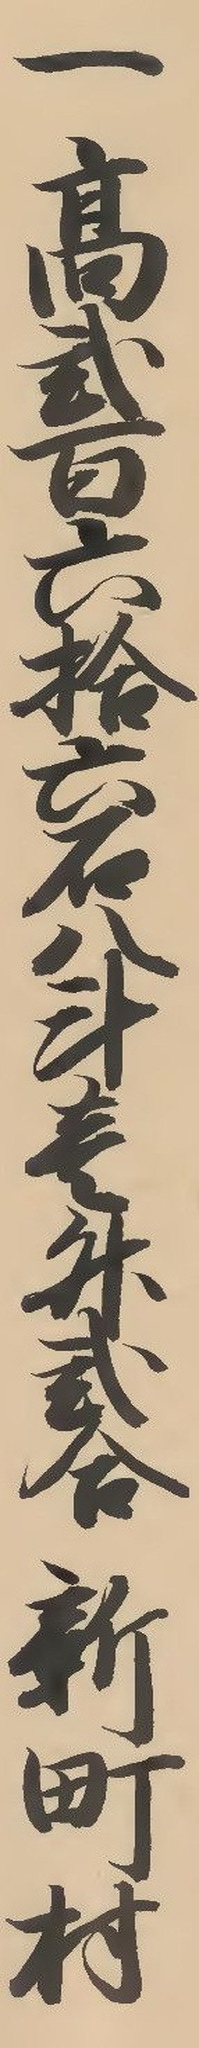一高弐百六拾六石八斗壱升弐合新町村
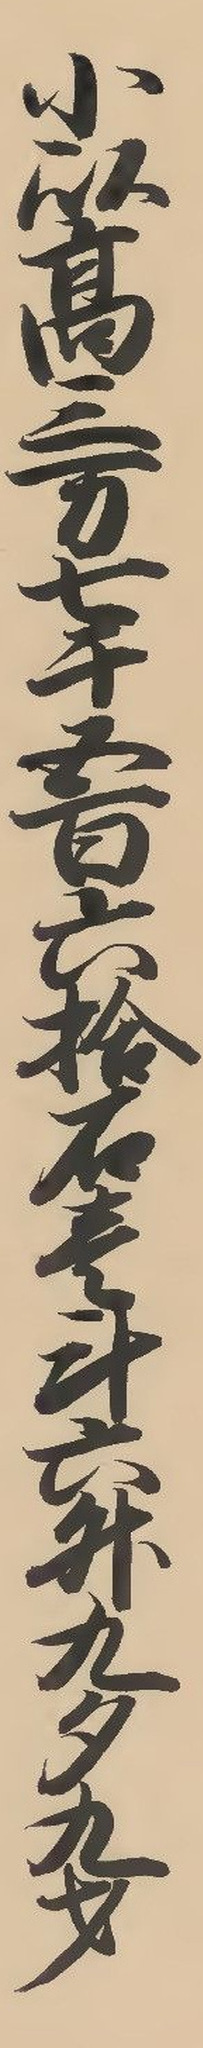小以高三万七千五百六拾石壱斗六升九勺九才

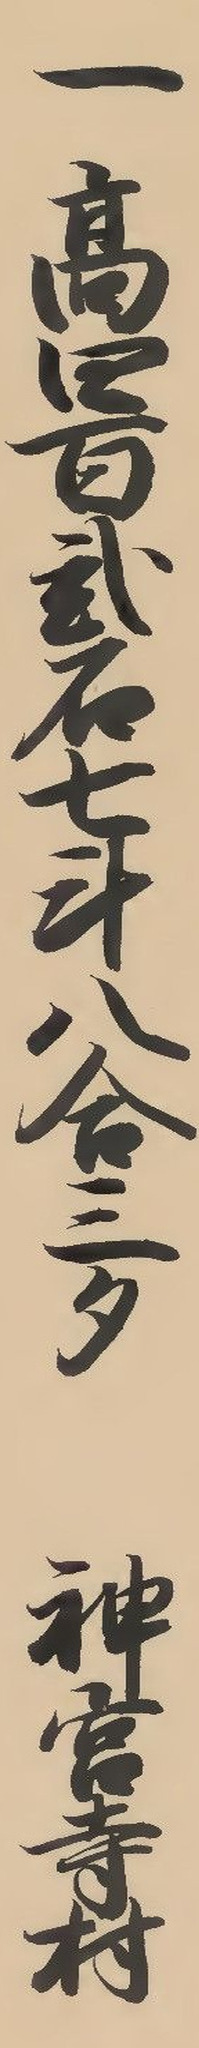一高四百弐石七斗八合三勺神宮寺村
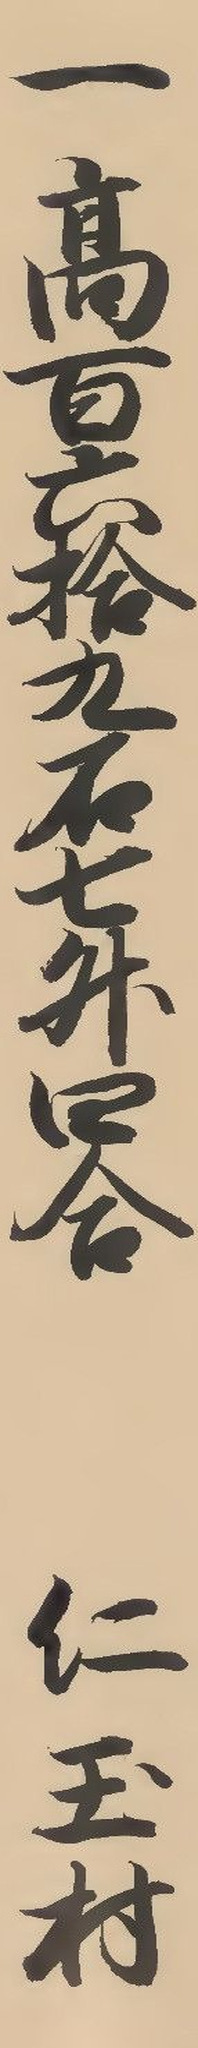一高百六拾九石七升四合仁玉村
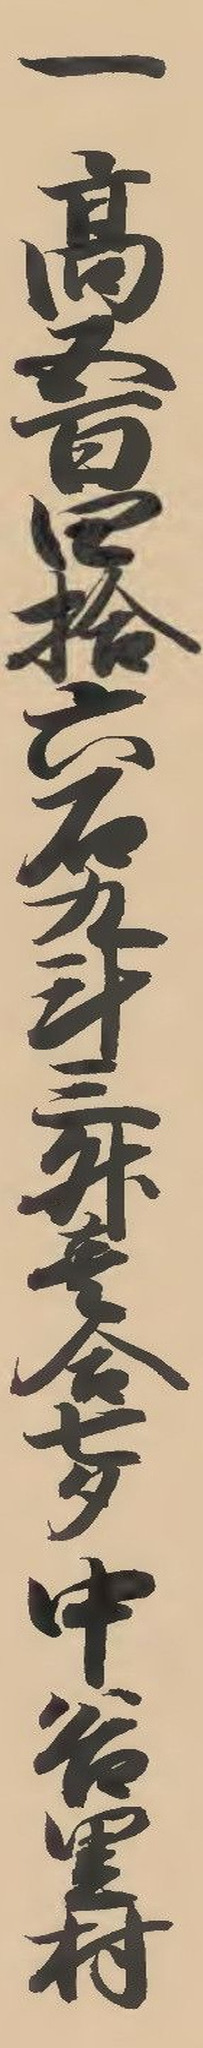一高五百四拾六石九斗三升壱合七勺中谷里村
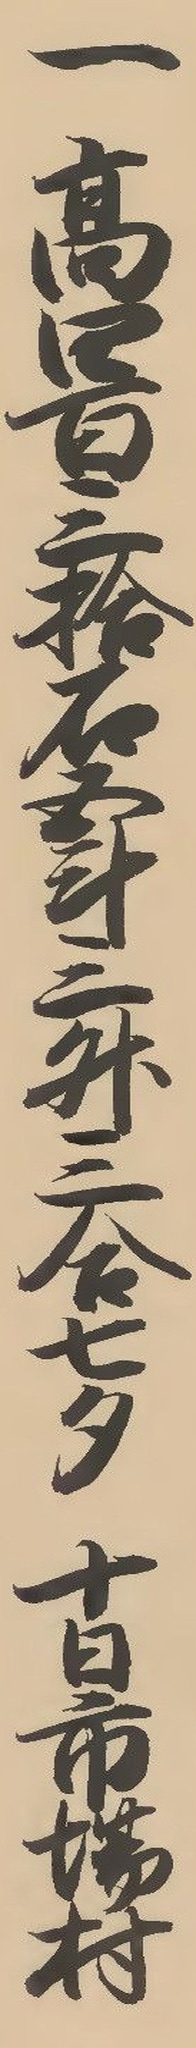一高四百三拾石五斗三升三合七勺十日市場村
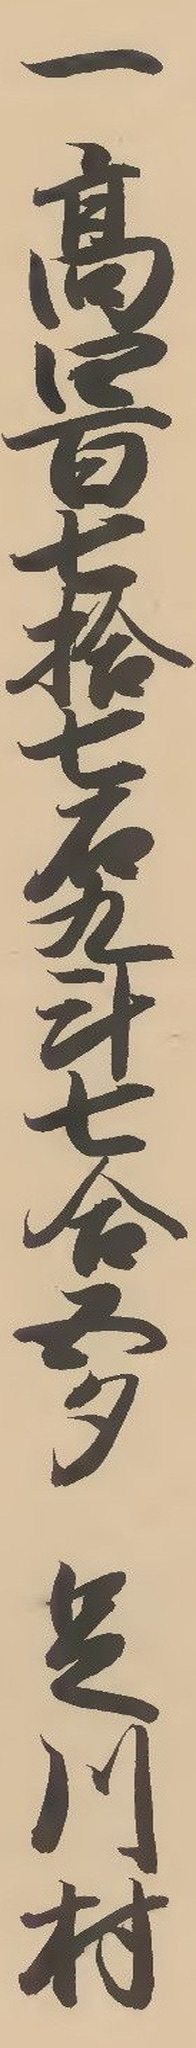一高四百七拾七石九斗七合五勺足川村
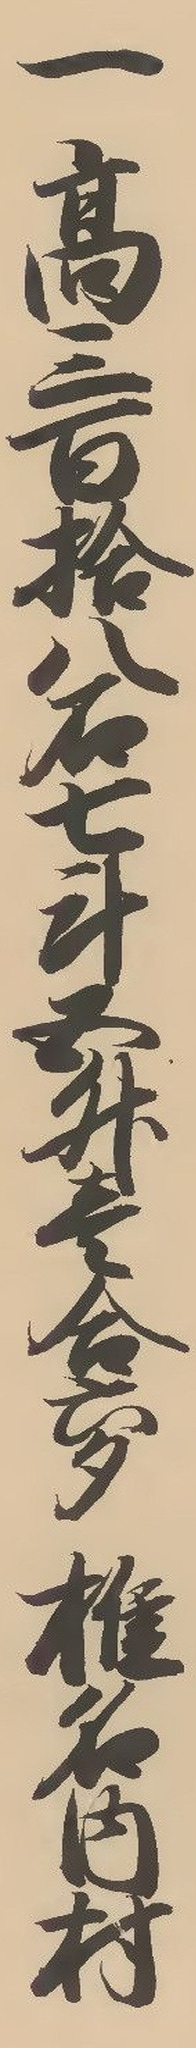一高三百拾八石七斗五升壱合六勺椎名内村

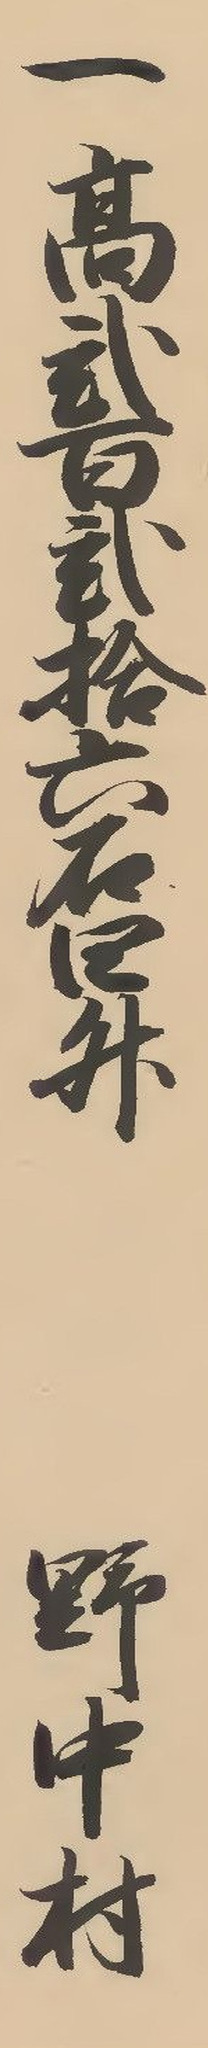一高弐百弐拾六石四升野中村
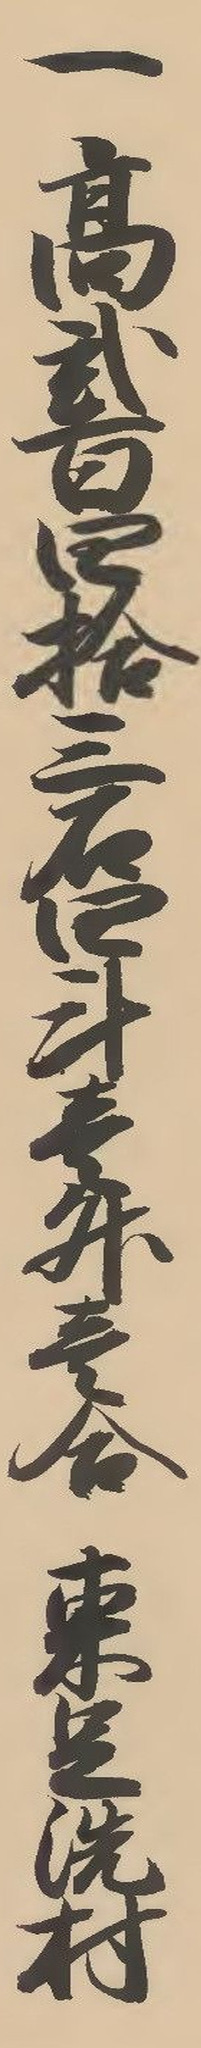一高弐百四拾三石四斗壱升壱合東足洗村
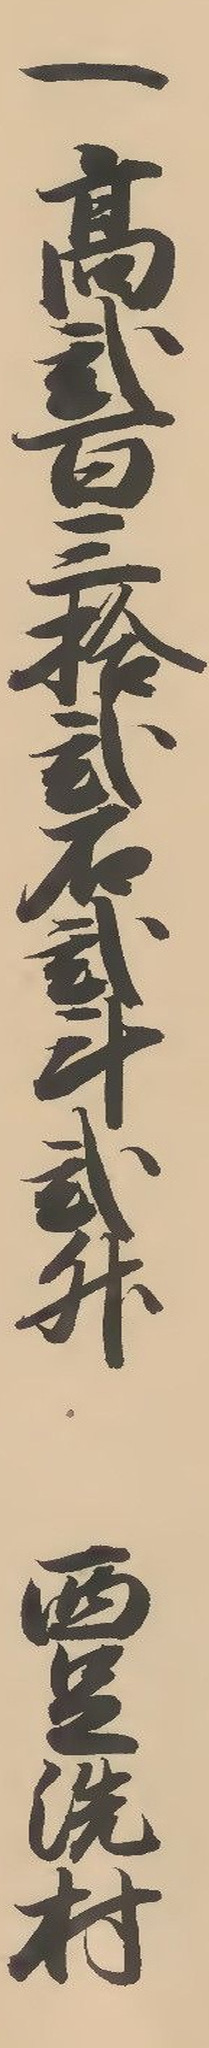一高弐百三拾弐石弐斗弐升西足洗村
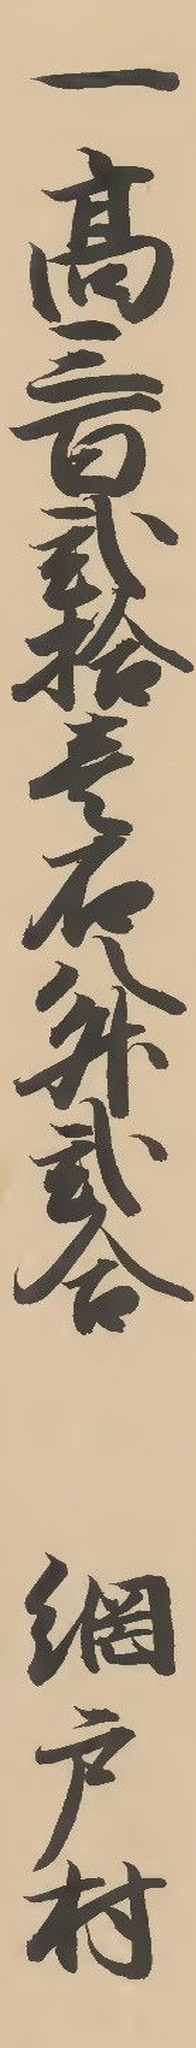一高三百弐拾壱石八升弐合網戸村
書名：下総国郷帳
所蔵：国立公文書館 National Archives of Japan
